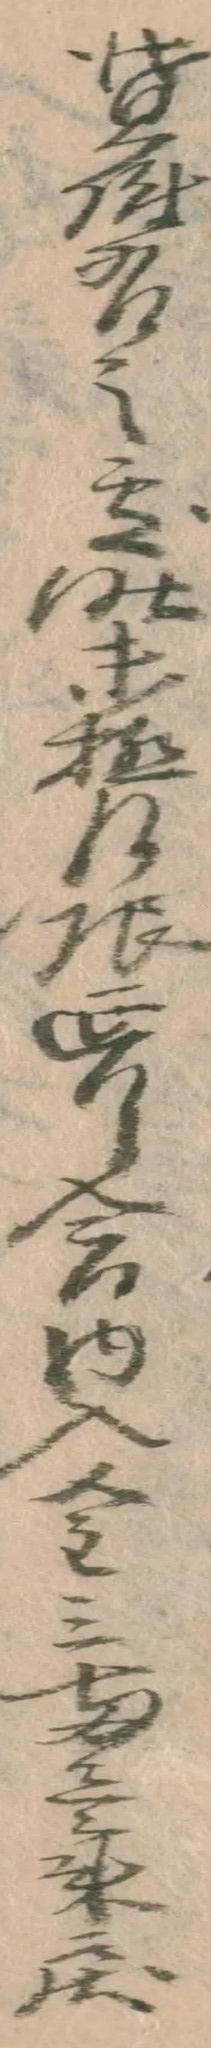貸附有之處昨未極月限延引今日内入金三両壱朱戻
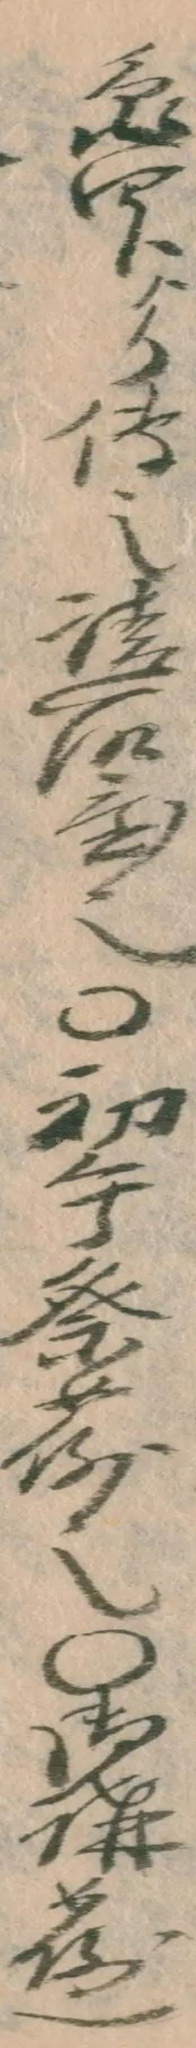亀四郎より傳之請取置也○初午祭如例也○御講如例也
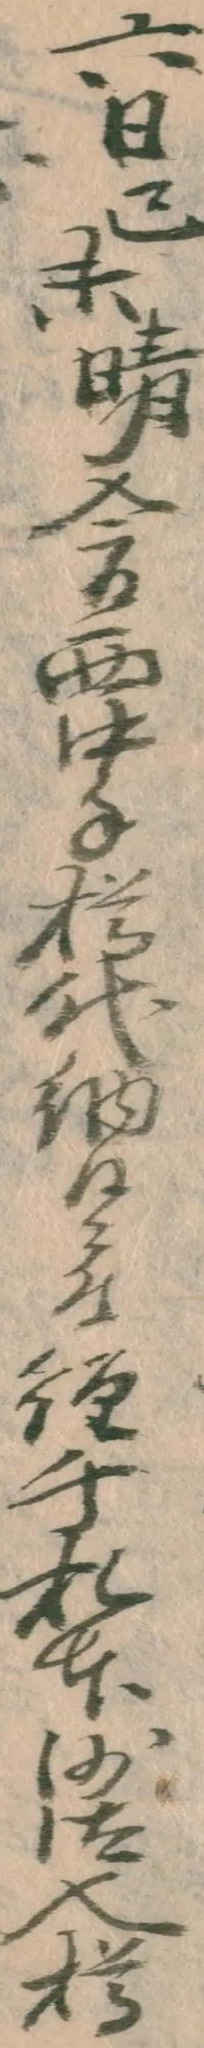六日己未晴今日西中手樽代納日ニ付経千札本沙汰人樽
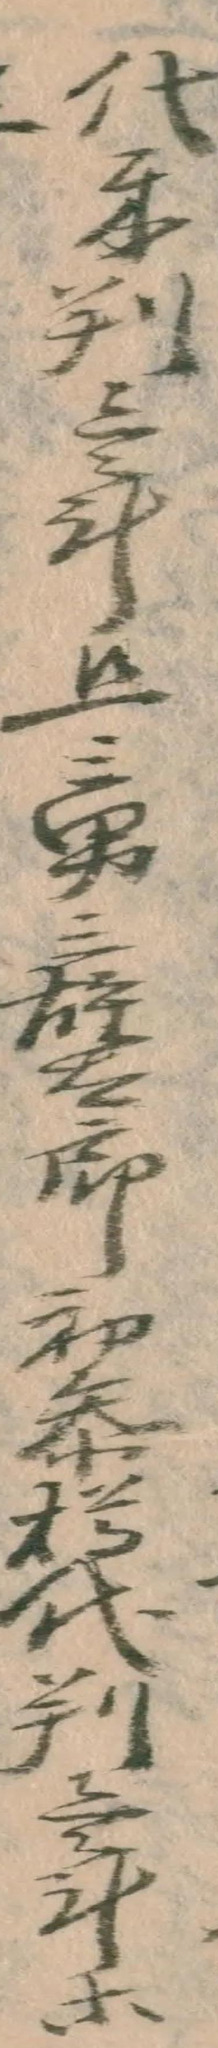代米判壱斗且三男三雄太郎初参樽代判壱斗等
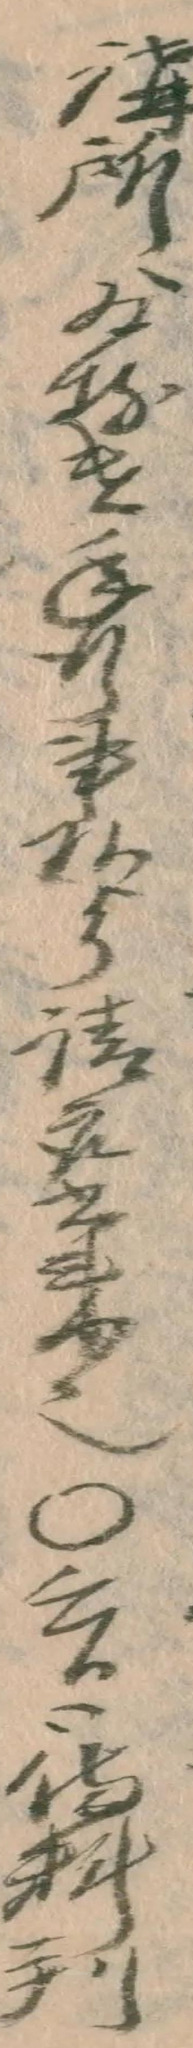講所へ為持遣年行事頭より請取書来也○今日御備料判
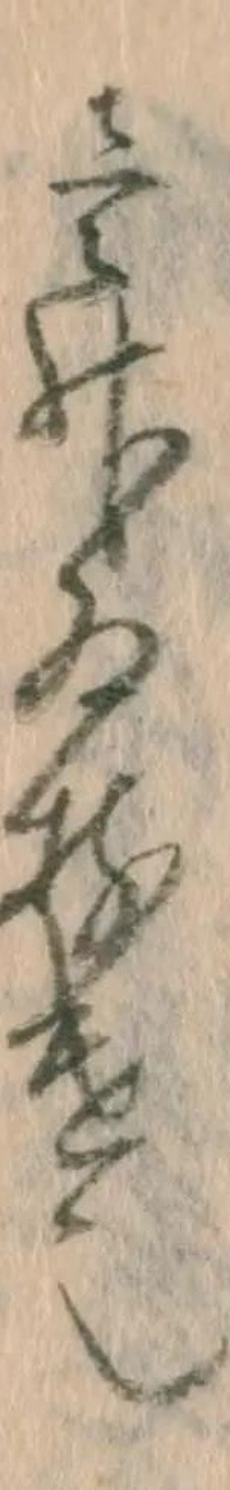壱升為持遣也
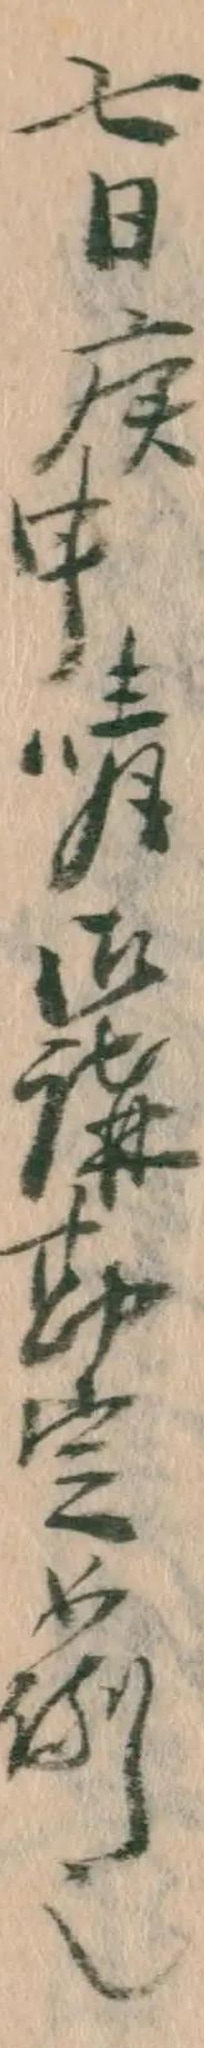七日庚申晴御講勘定定如例也
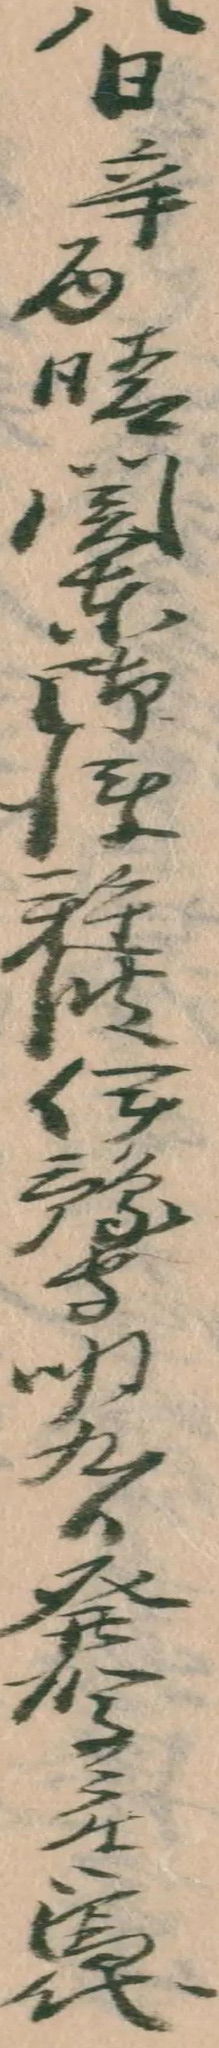八日辛酉曇関東御使難波伊豫守明九日発駕ニ付御馬代
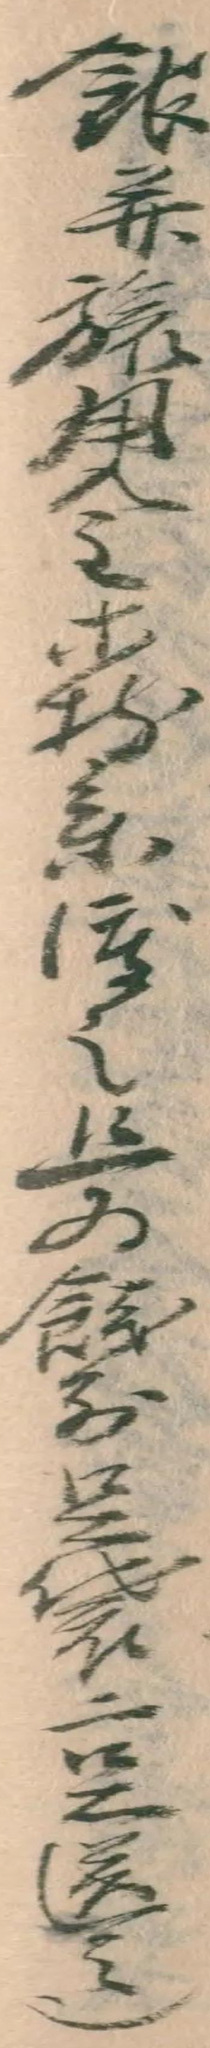銀幷旅用金等持参渡之且為餞別足袋二足送之也
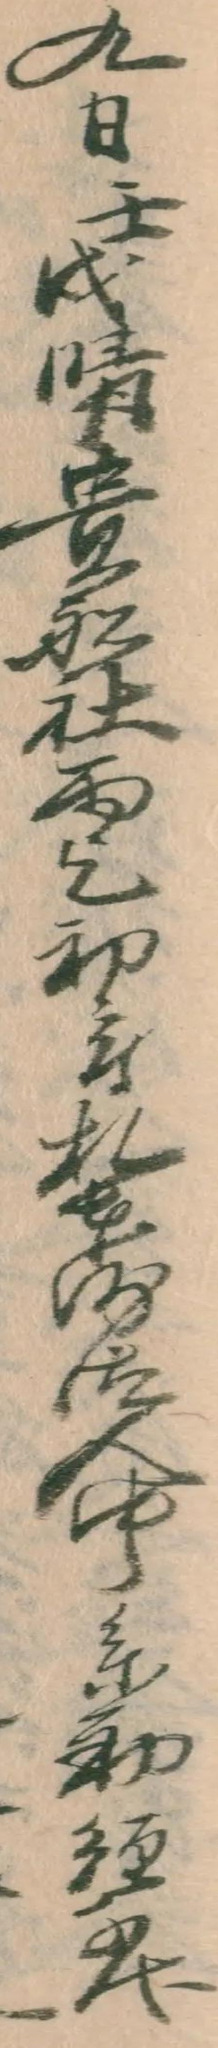九日壬戌晴貴舩社雨乞初ニ付札本沙汰人中参勤経千代
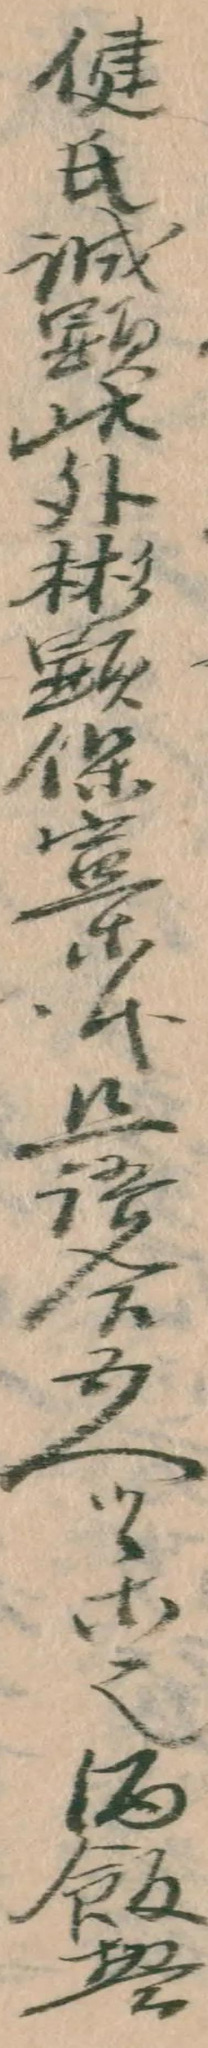健氏誠顕此外彬顕保宜等代且語合五人ツヽ等也酒飯惣而
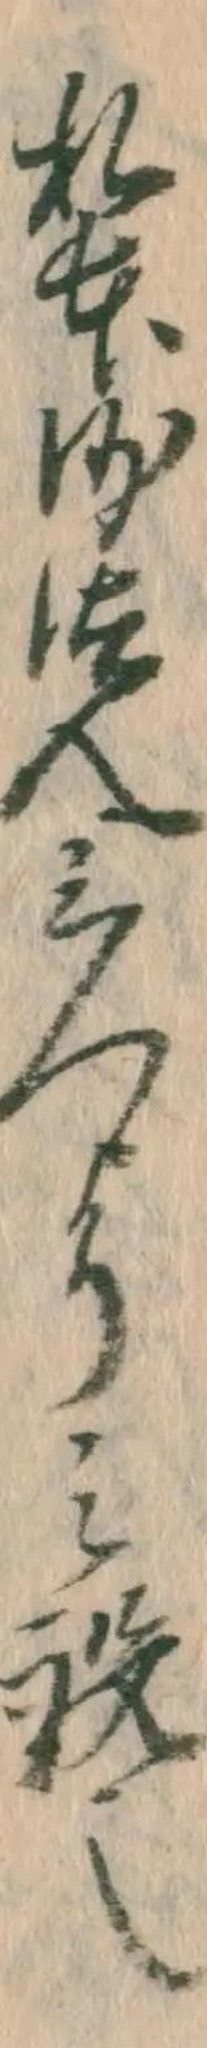札本沙汰人三人より之設也
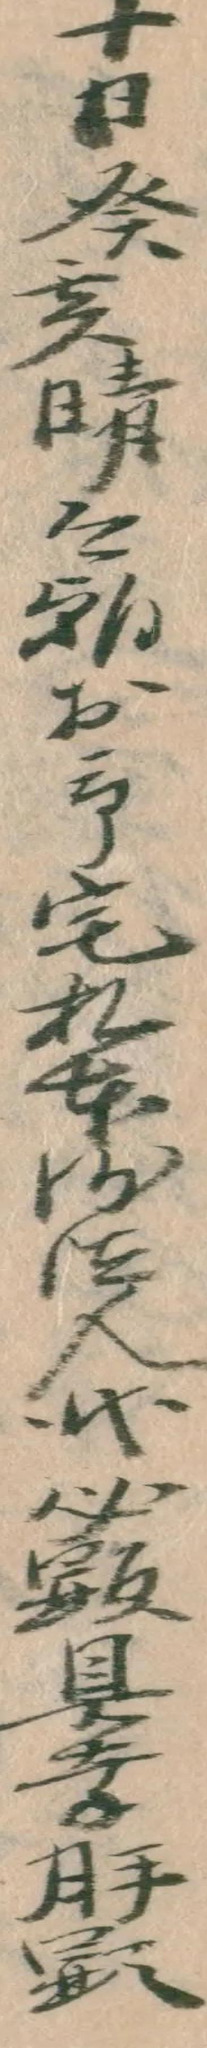十日癸亥晴今朝於予宅札本沙汰入代必顕具幸胖顕
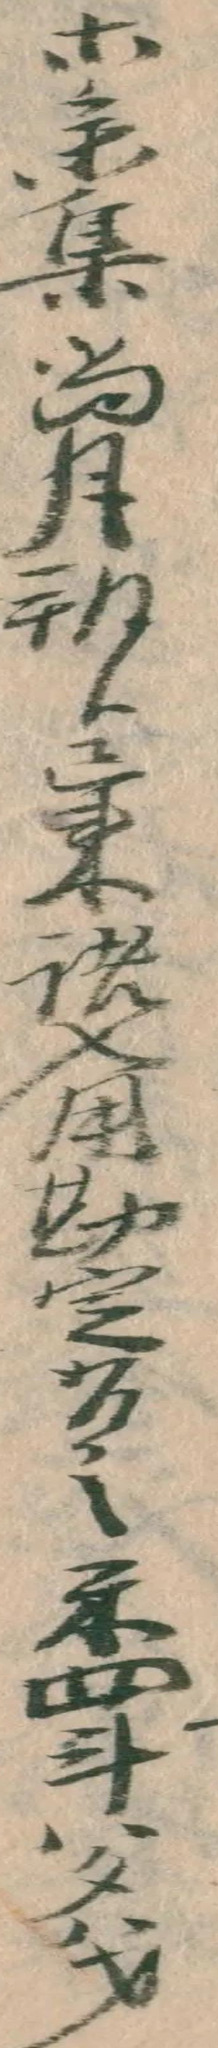等参集當月朔日已来諸入用勘定有之米四斗ハタハ才
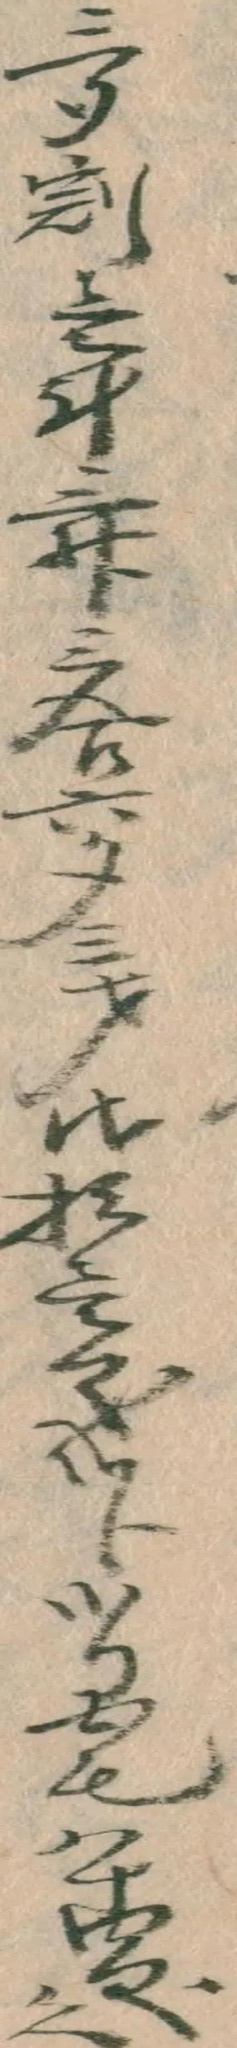三ツ割壱斗三升三合六勺三才代拾壱匁弐分弐厘弐毛八十四文也
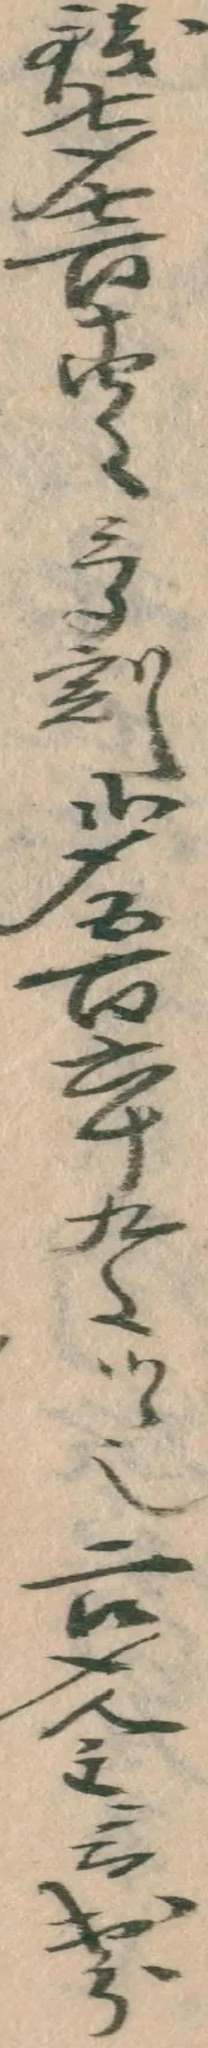銭七〆七百十四文三夕割弐〆五百六十九匁ツヽ也二口〆金ニ而出分
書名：賀茂社記録. 第67冊
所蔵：国立国会図書館 National Diet Library, JAPAN
